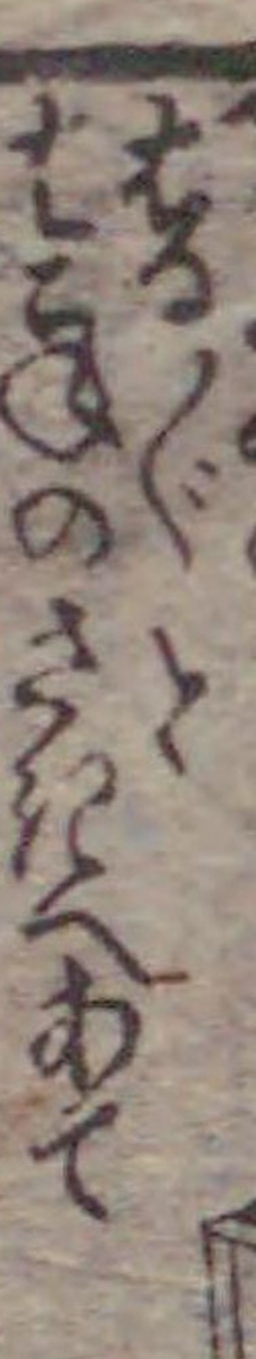はこねのさきへあて
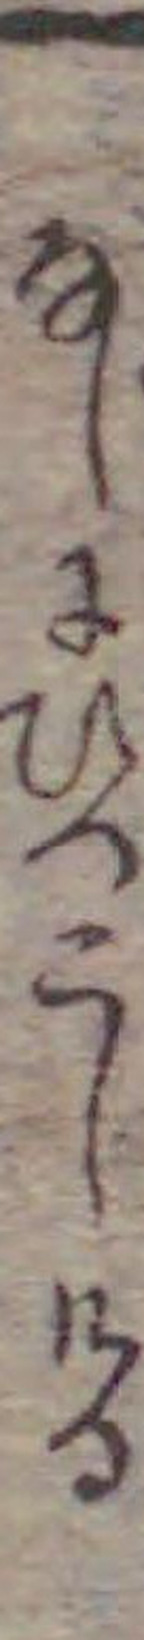なしにひつこしける

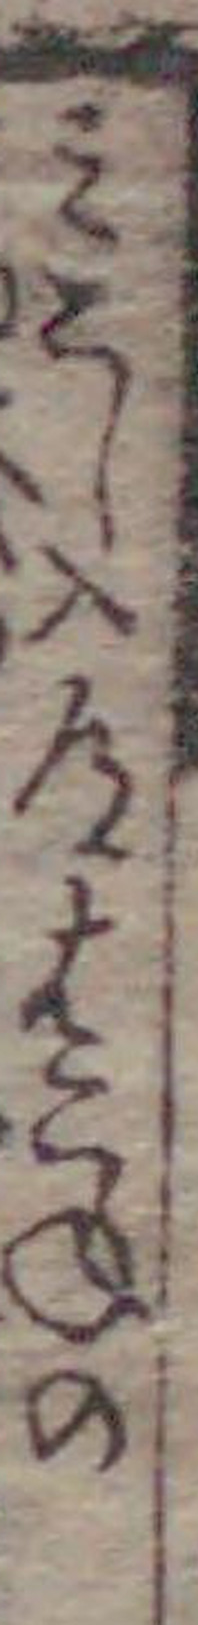みこし入道はこねの
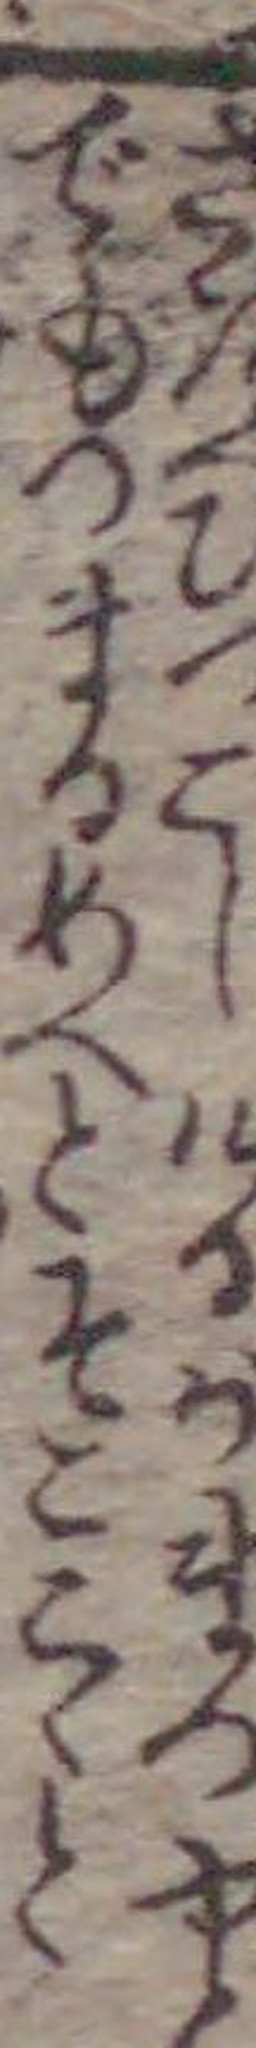でもつまるめへとそここゝと
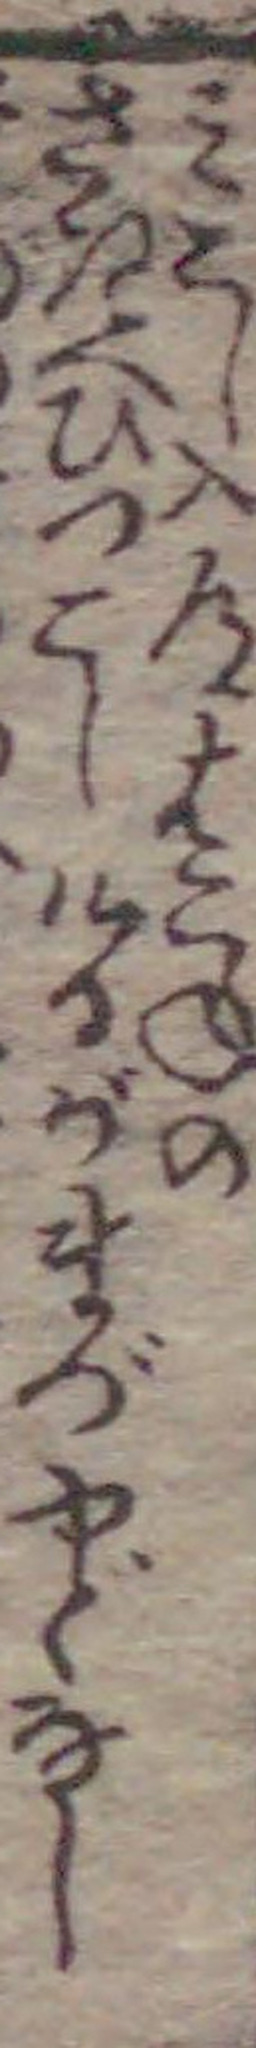さきへひつこしけるがまづやどなし
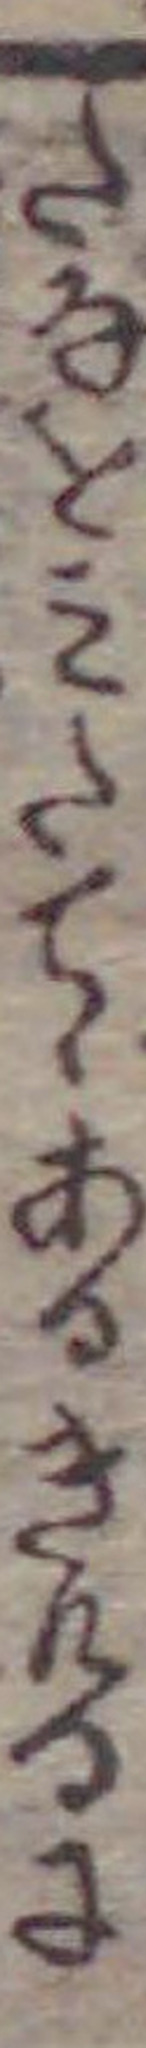たなをみたてゝあるきけるに
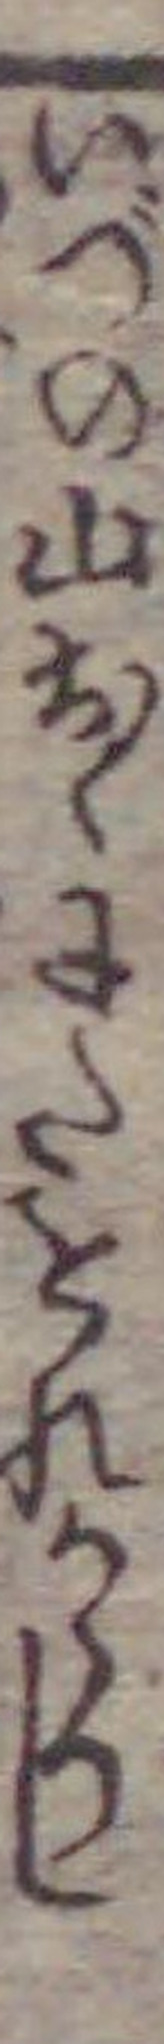いづの山おくにたをれかゝりし
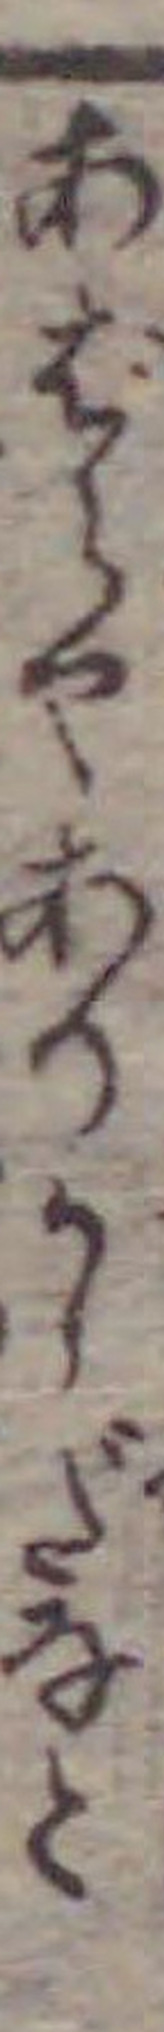あばらやありかしだなと
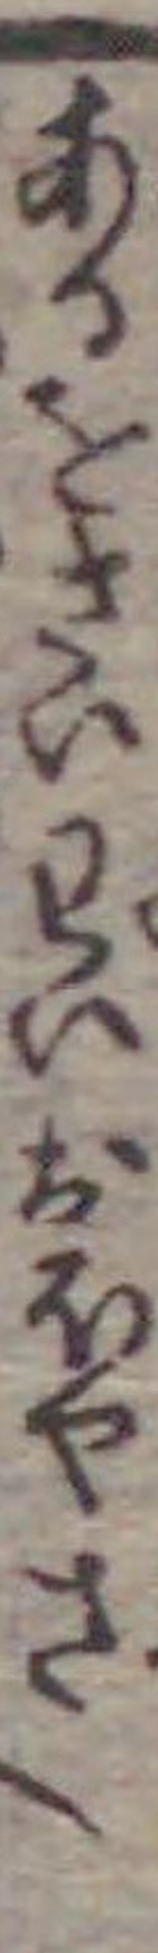あるをさいわいおほやさ
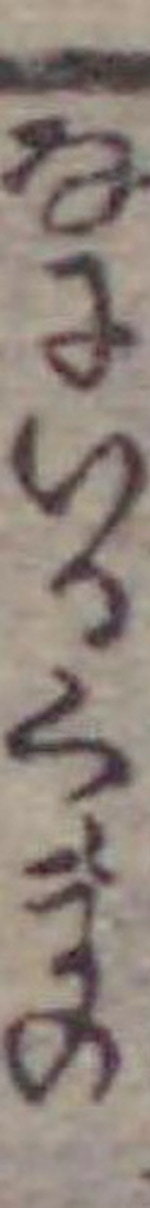なにいるくまの
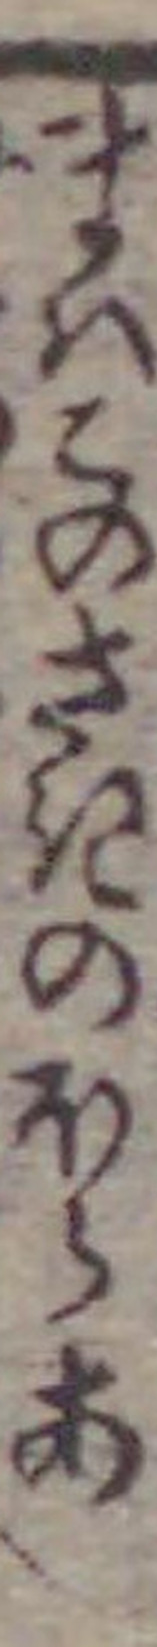まはこのさきのほらあ
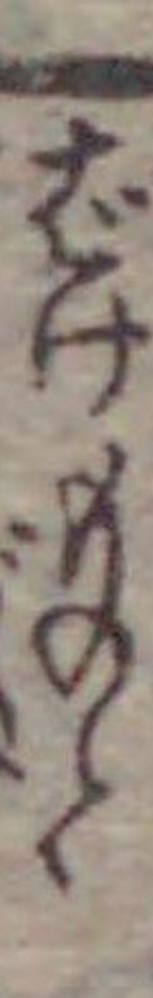ばけものと
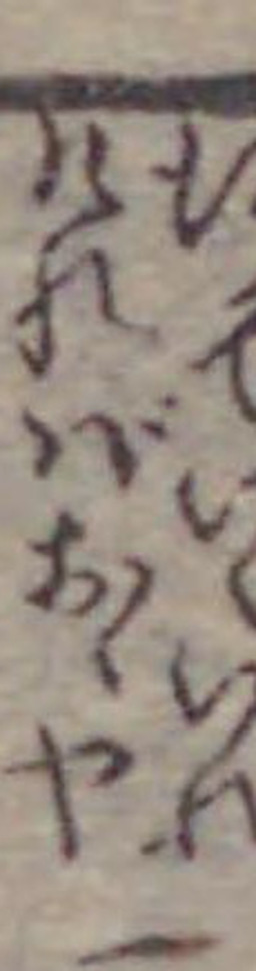ければおゝや
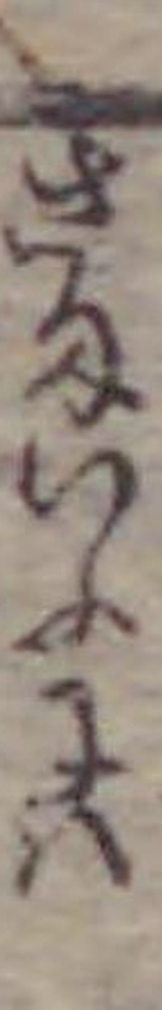さまいふには
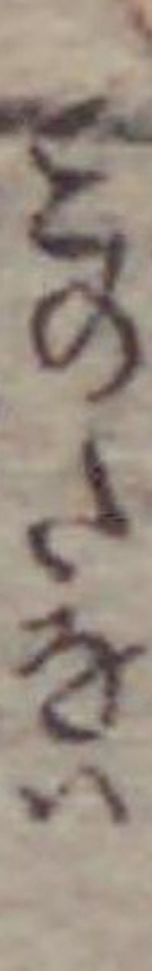このたなは
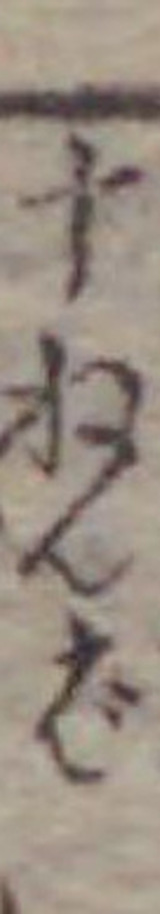十ねんば
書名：化物見世開 : 2巻
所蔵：国立国会図書館 National Diet Library, JAPAN
